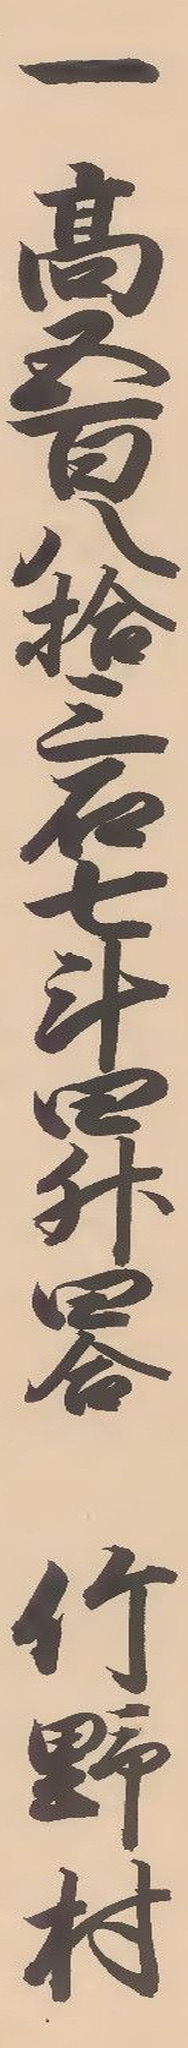一高五百八拾三石七斗四升四合竹野村
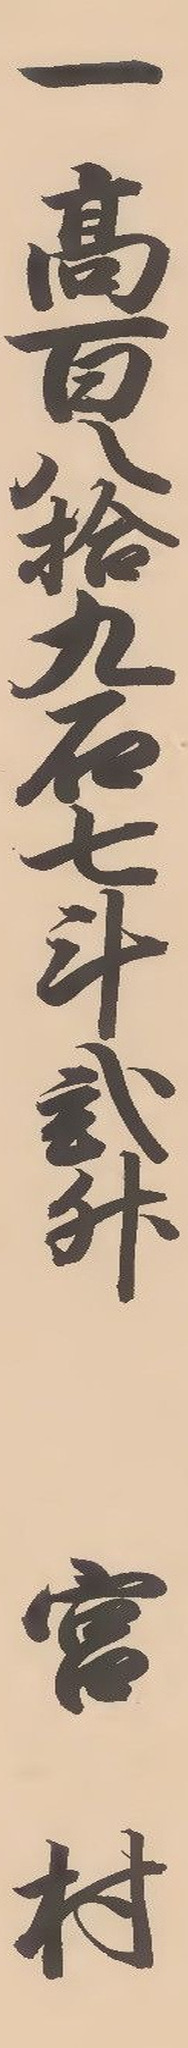一高百八拾九石七斗弐升宮村
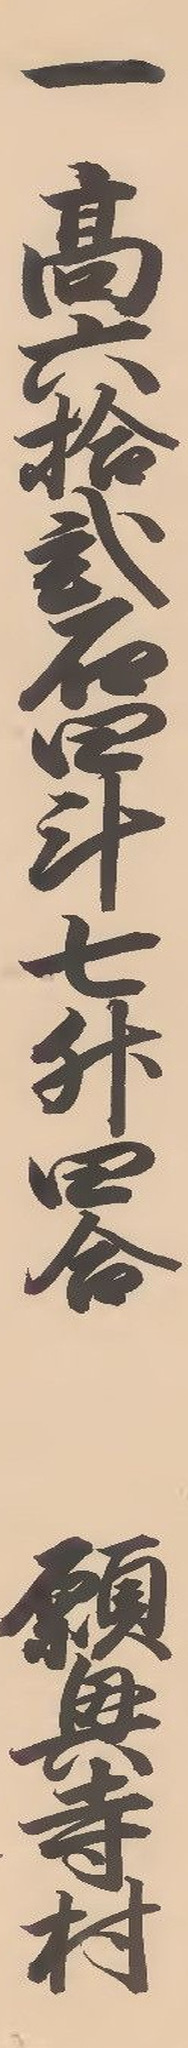一高六拾弐石四斗七升四合願興寺村
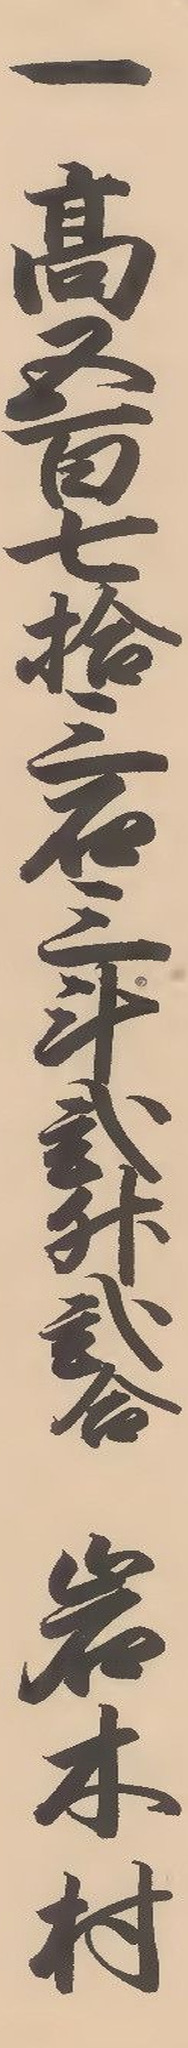一高五百七拾三石三斗弐升弐合岩木村
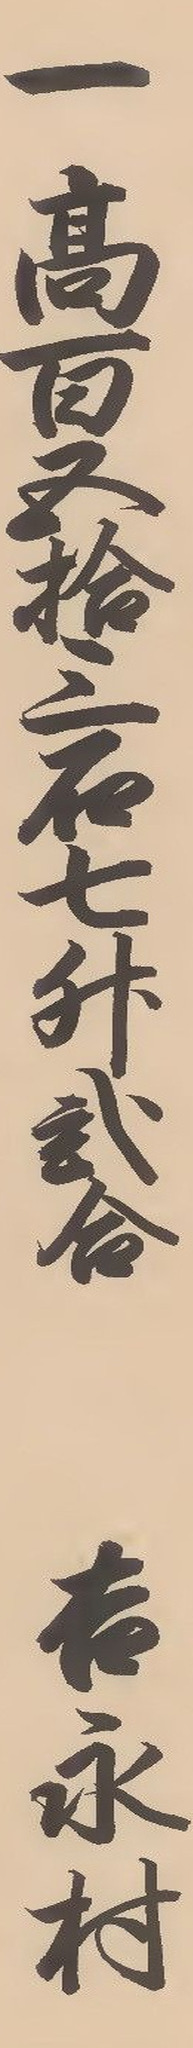一高百五拾三石七升弐合吉永村

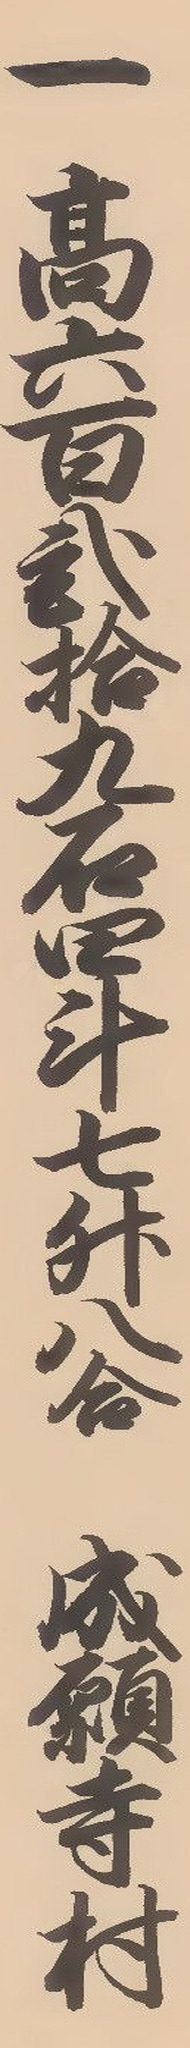一高六百弐拾九石四斗七升八合成願寺村
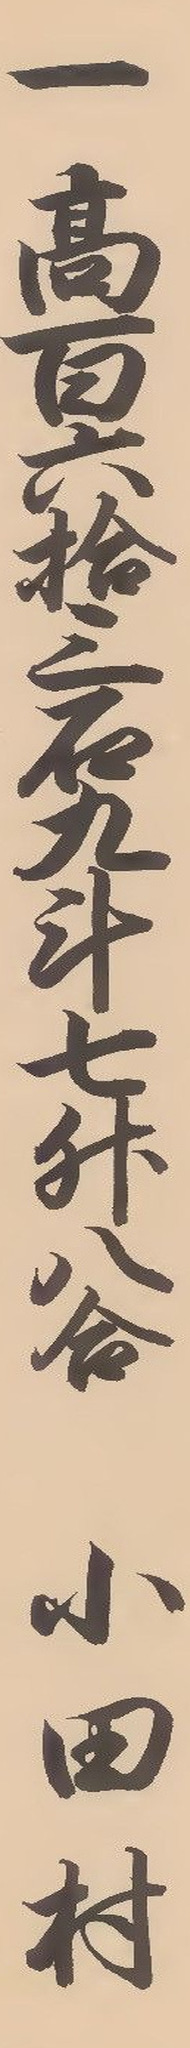一高百六拾三石九斗七升八合小田村
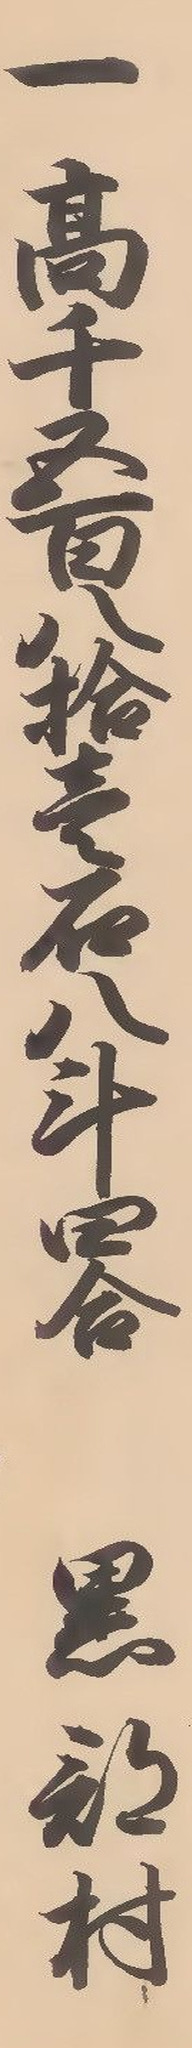一高千五百八拾壱石八斗四合黒部村

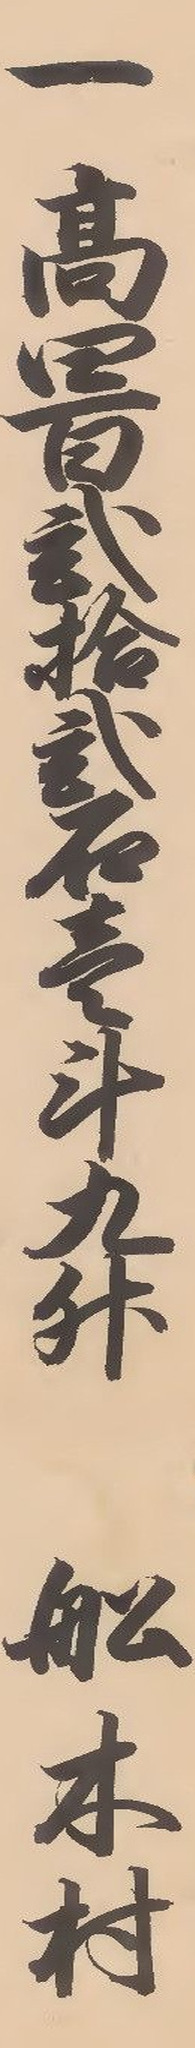一高四百弐拾弐石壱斗九升船木村
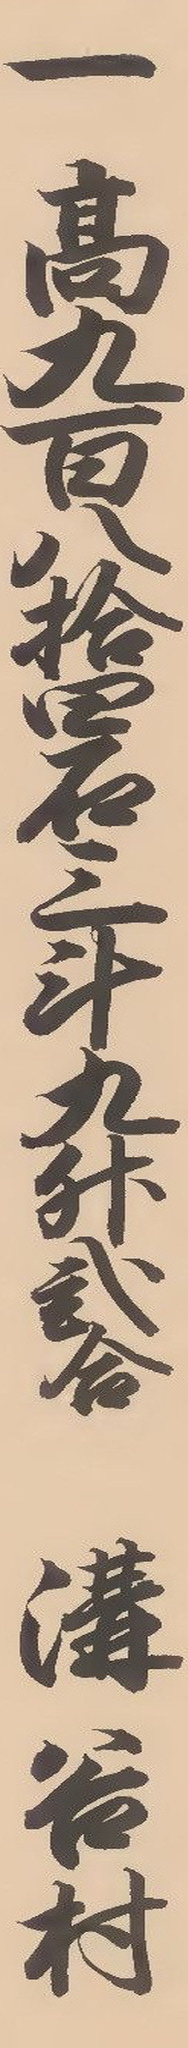一高九百八拾四石三斗九升弐合溝谷村
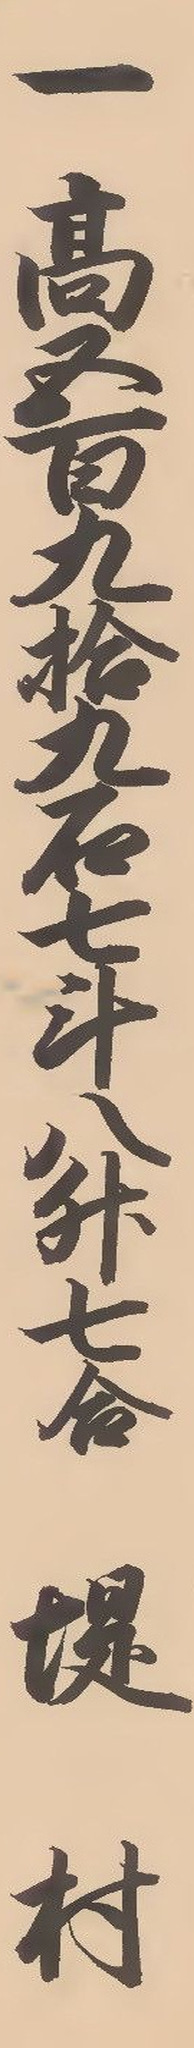一高五百九拾九石七斗八升七合堤村
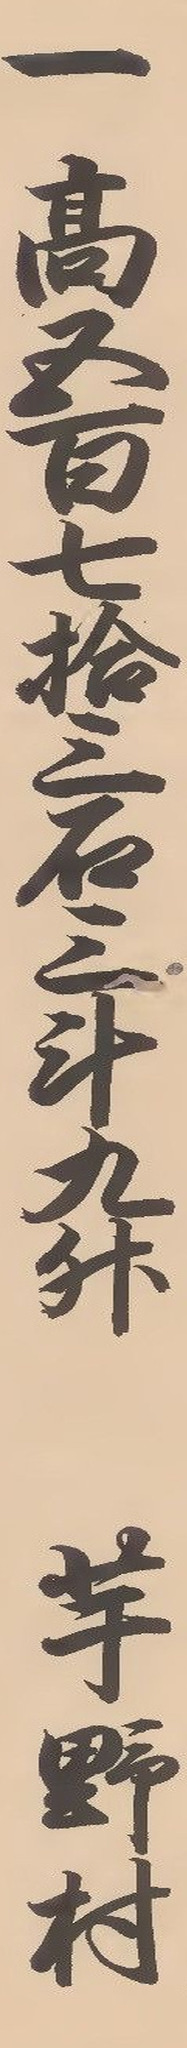一高五百七拾三石三斗九升芋野村
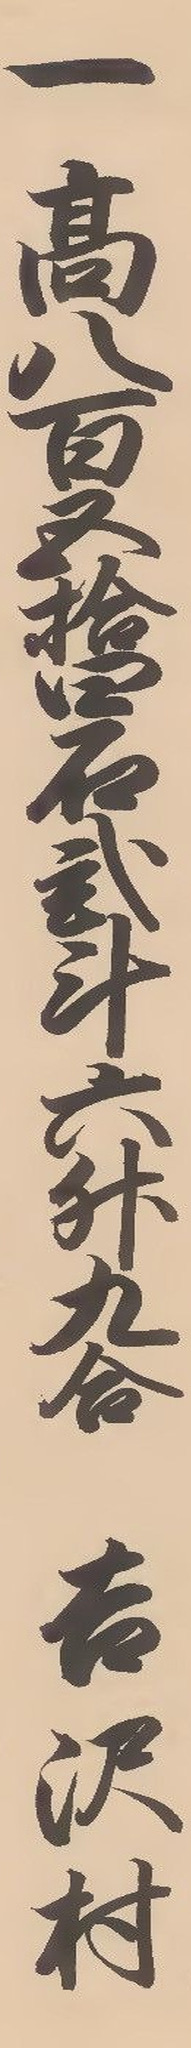一高八百五拾四石弐斗六升九合吉沢村
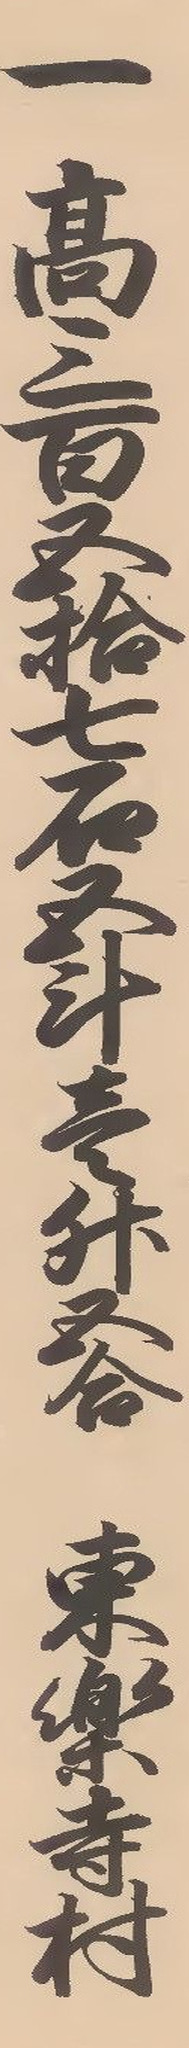一高三百五拾七石五斗壱升五合東楽寺村
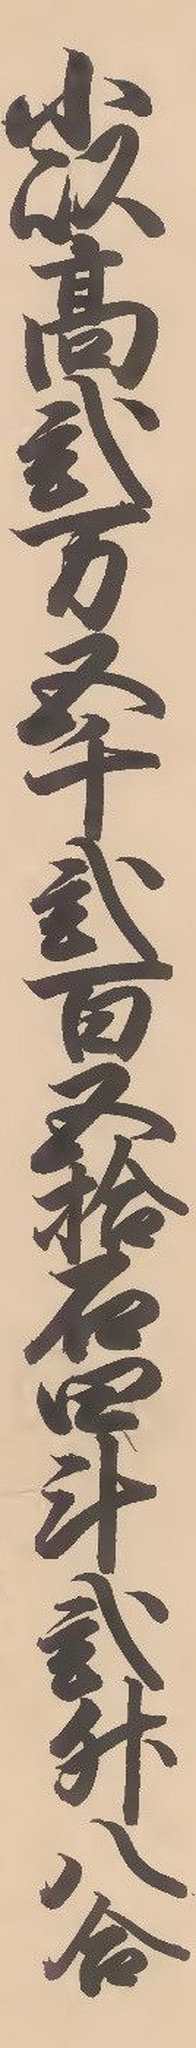小以高弐万五千弐百五拾石四斗弐升八合

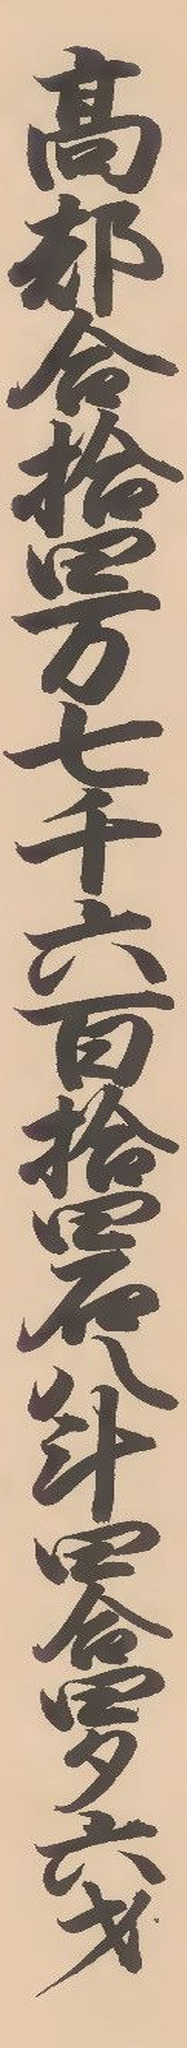高都合拾四万七千六百拾四石八斗四合四勺六才
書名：丹後国郷帳
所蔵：国立公文書館 National Archives of Japan
